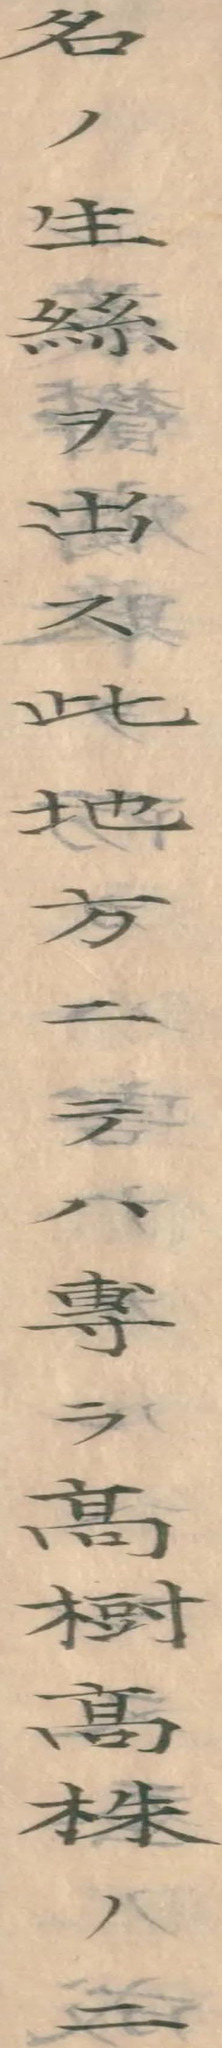名ノ生糸ヲ出ス此地方ニテハ専ラ高樹高株ノ二
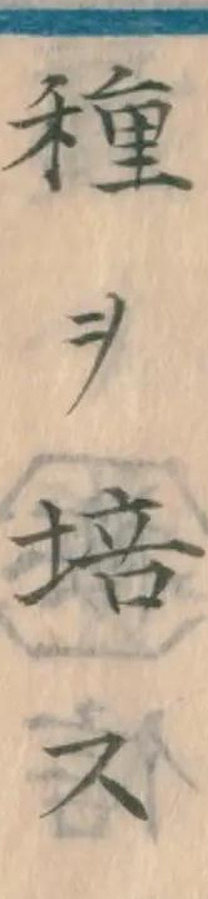種ヲ培ス
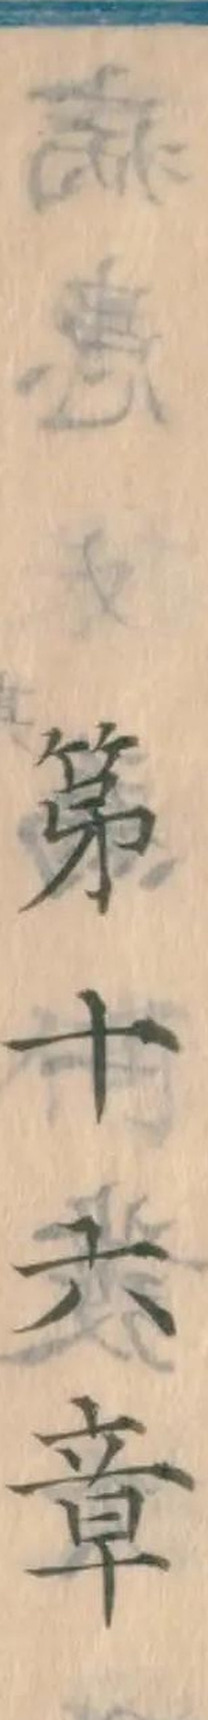第十六章
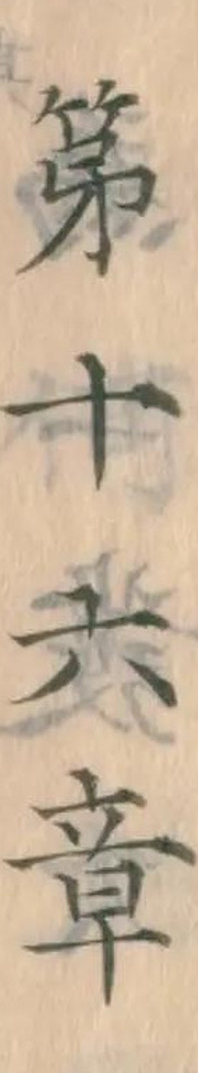第十六章
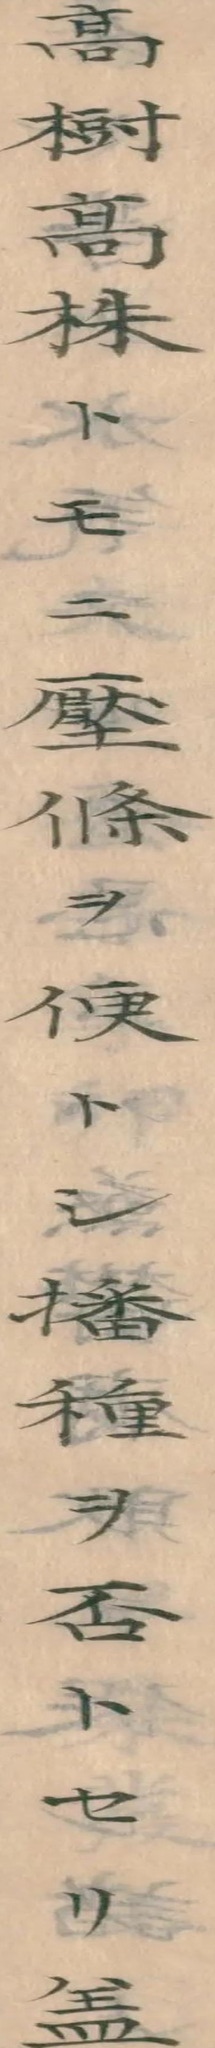高樹高株トモニ圧条ヲ便トシ播種ヲ否トセリ蓋
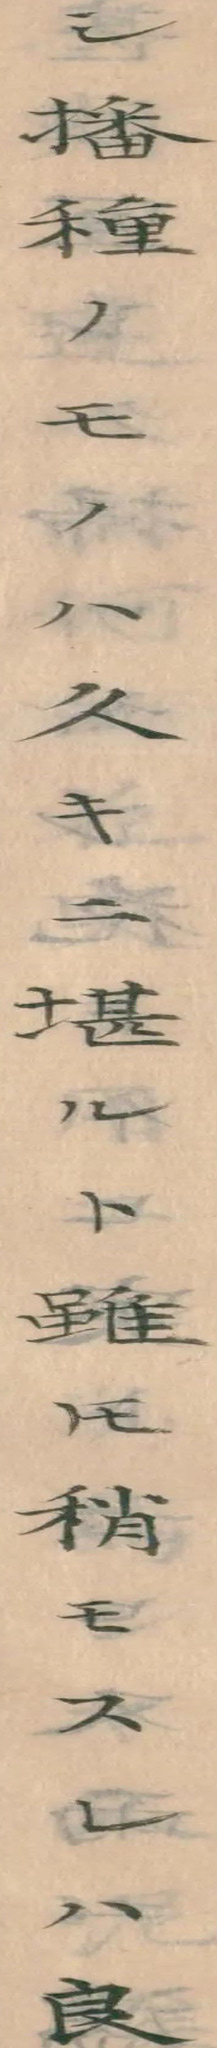シ播種ノモノハ久キニ堪ルト雖トモ稍モスレハ良
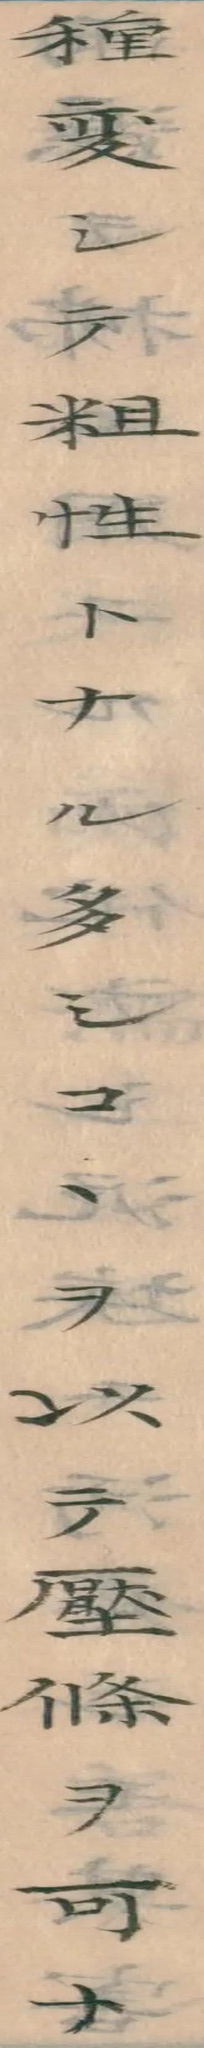種変シテ粗性トナル多シコヽヲ以テ圧条ヲ可ナ
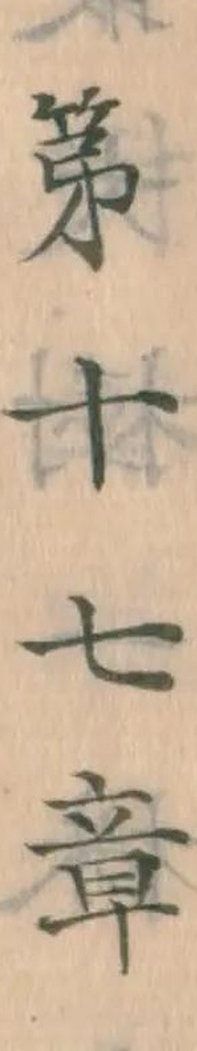第十七章
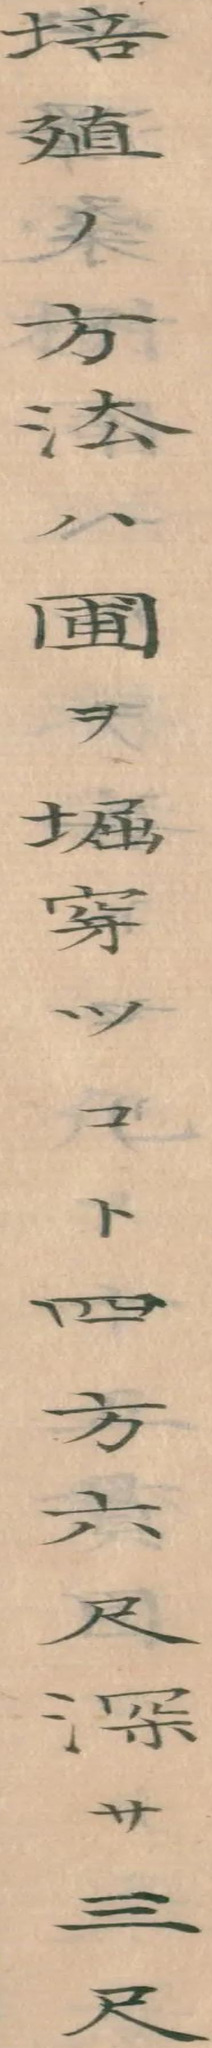培殖ノ方法ハ圃ヲ堀穿ツコト四方六尺深サ三尺
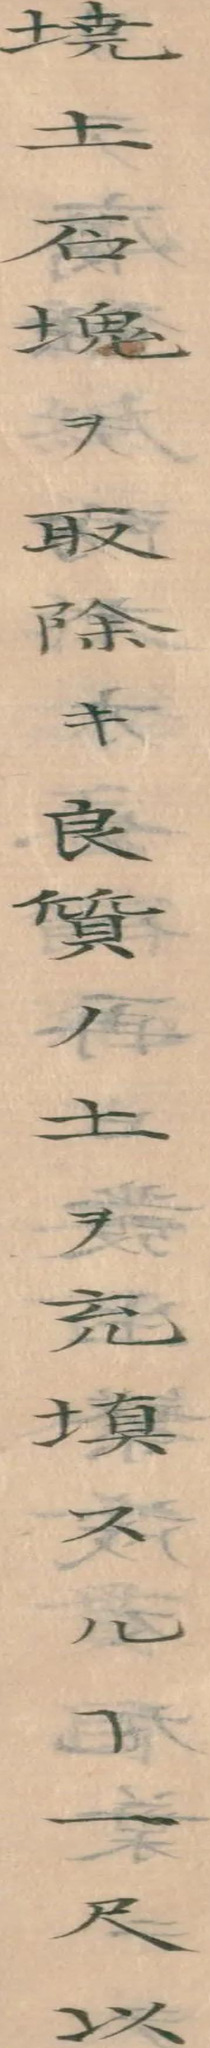墝土石塊ヲ取除キ良質ノ土ヲ充填スルコト一尺以
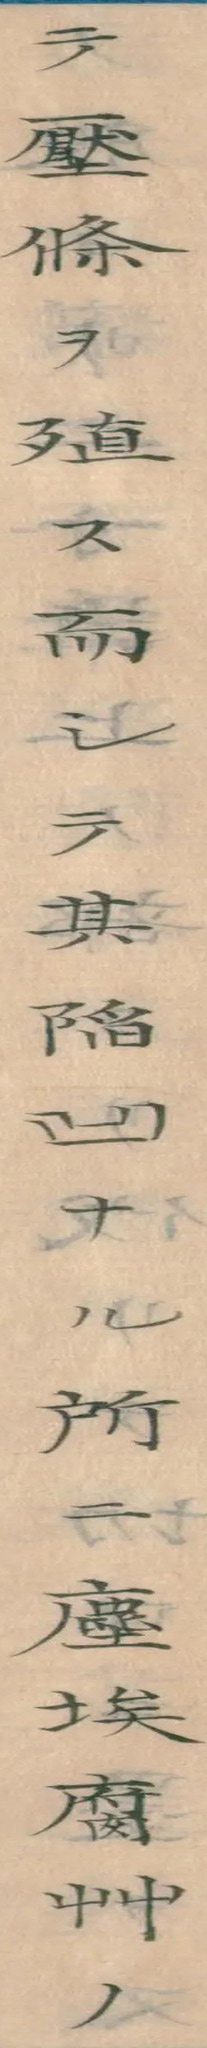テ圧条ヲ殖ス而シテ其陥凹ナル所ニ塵埃腐艸ノ
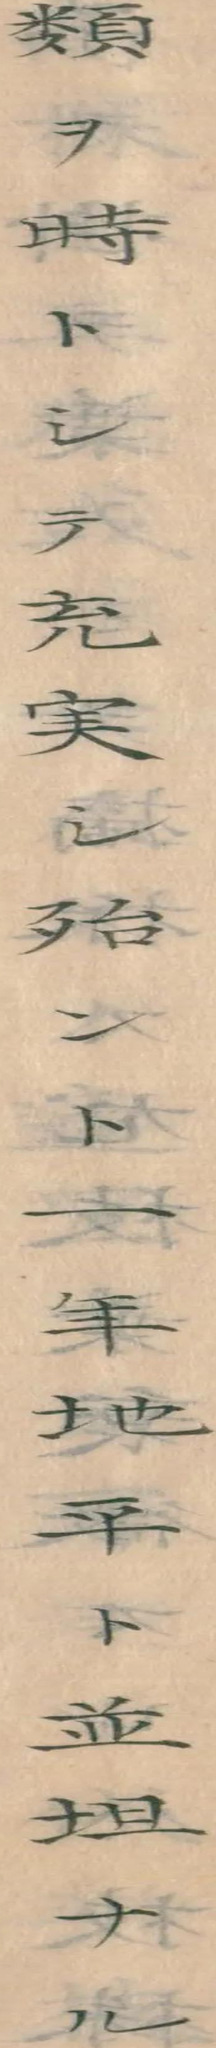類ヲ時トシテ充実シ殆ント一年地平ト並坦ナル
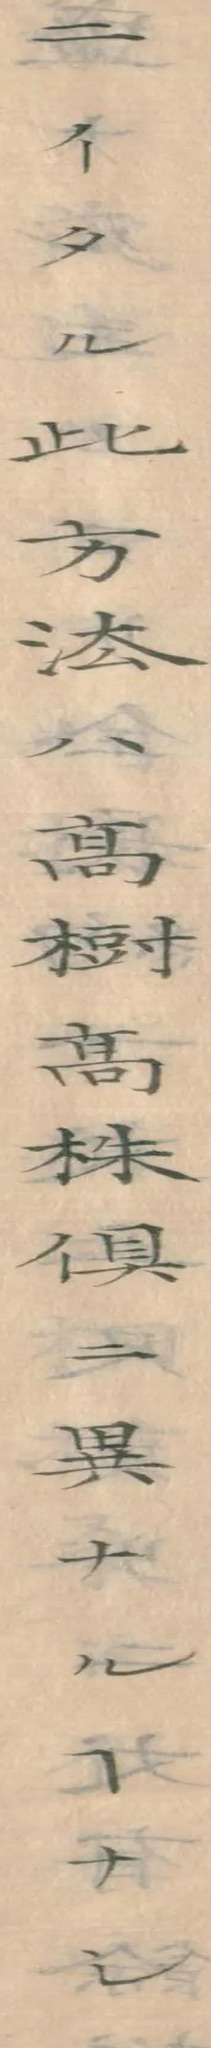ニイタル此方法ハ高樹高株倶ニ異ナルコトナシ
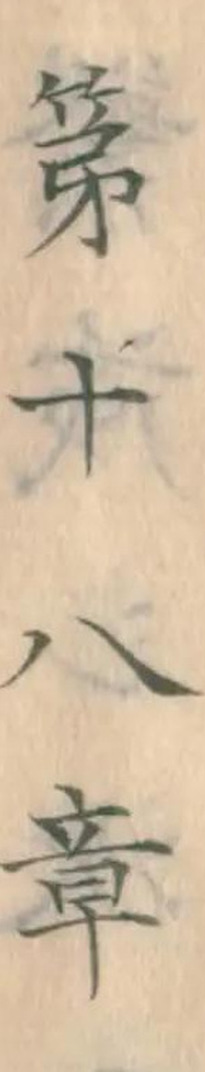第十八章
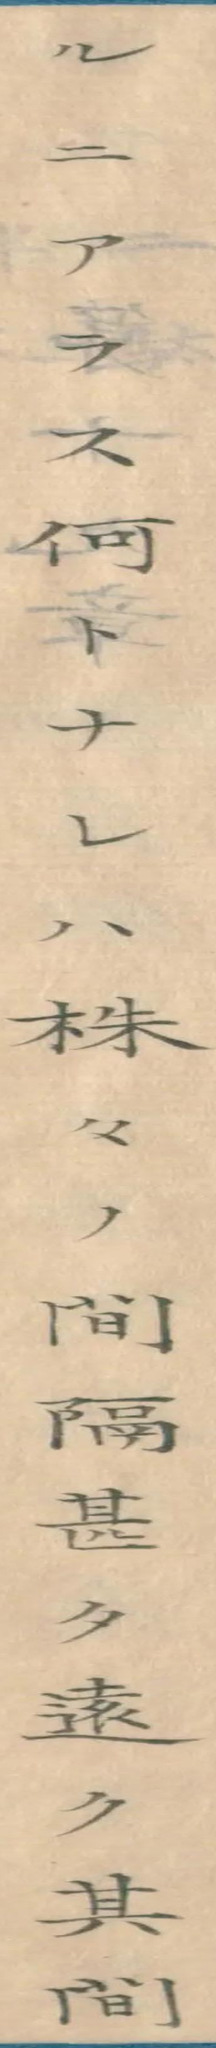ルニアラス何トナレハ株々ノ間隔甚タ遠ク其間
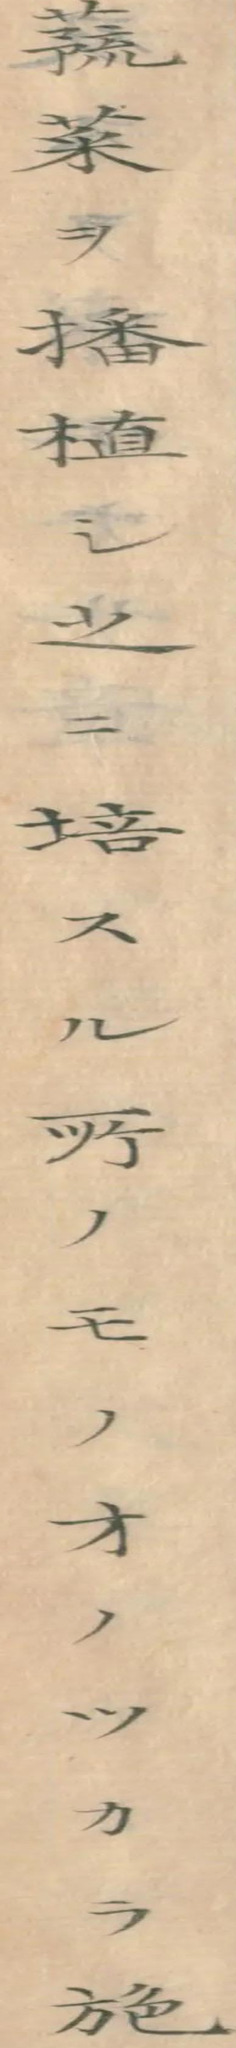菜ヲ播植シ之ニ培スル所ノモノオノツカラ施
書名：蚕桑集成
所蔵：国立国会図書館 National Diet Library, JAPAN
